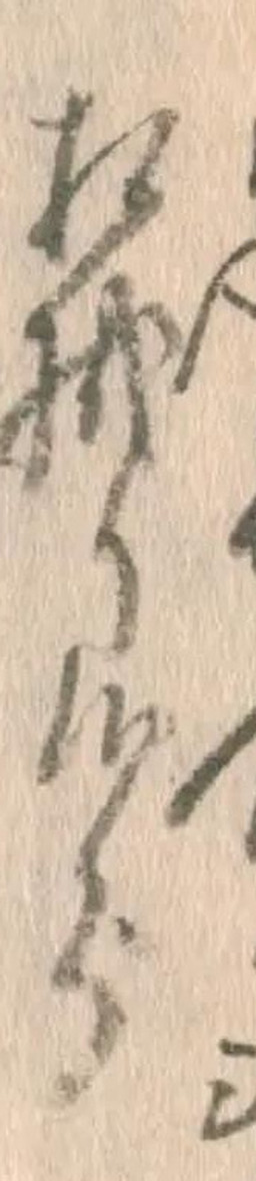相掛り候分
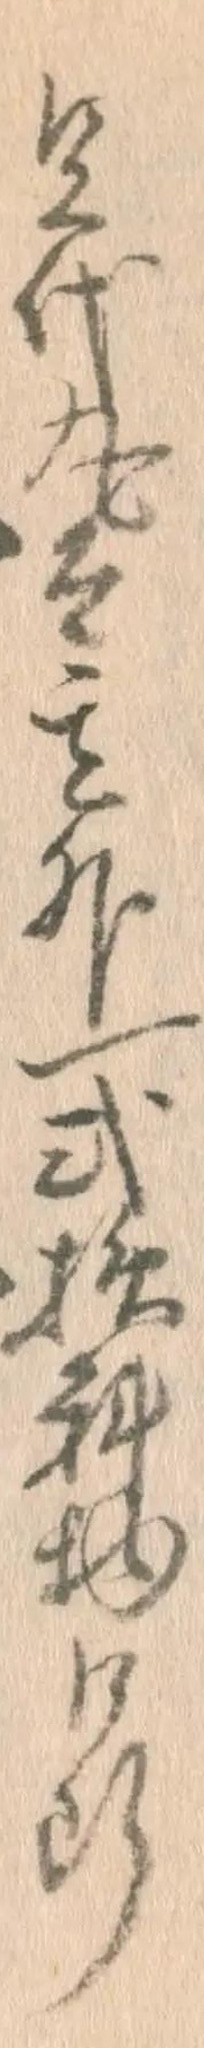足代丸太其外一式損料物同断

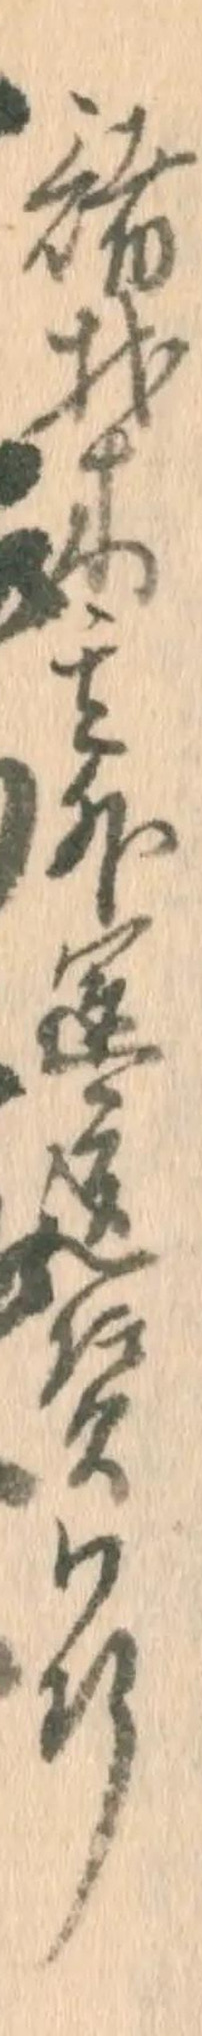諸材木其外運送賃同断
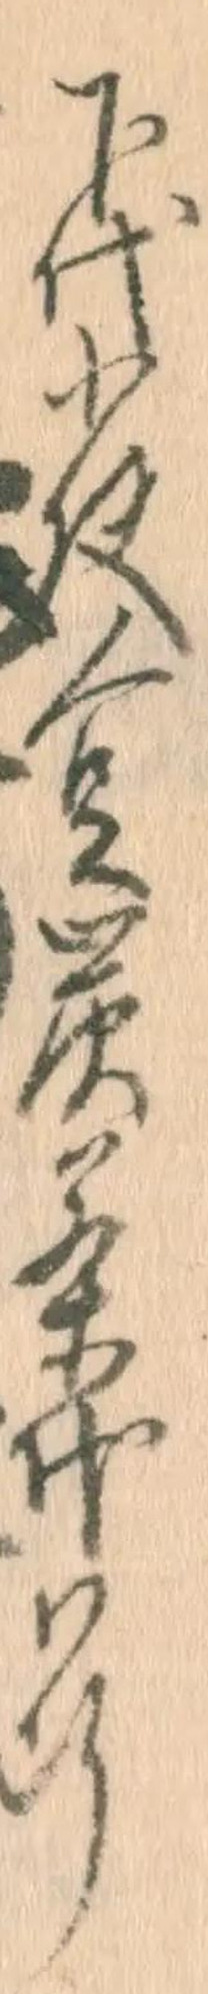下代小使人足炭草等代同断
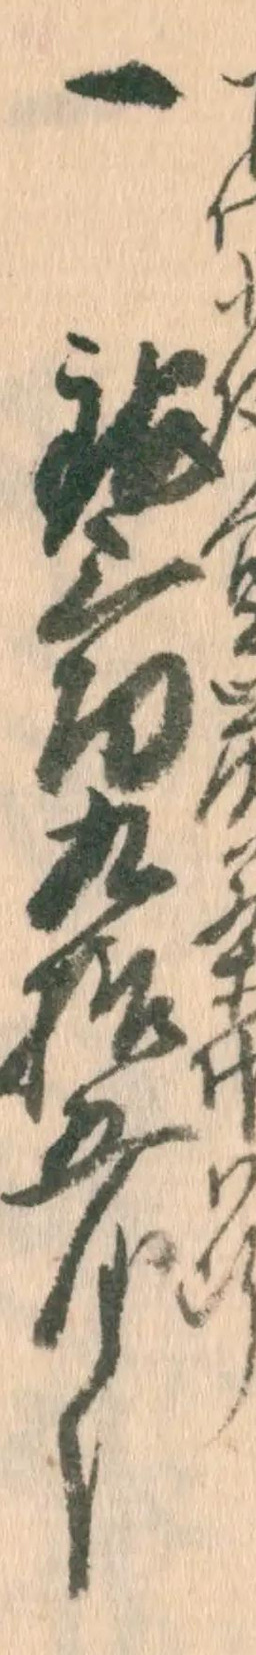一銀三百九拾五匁
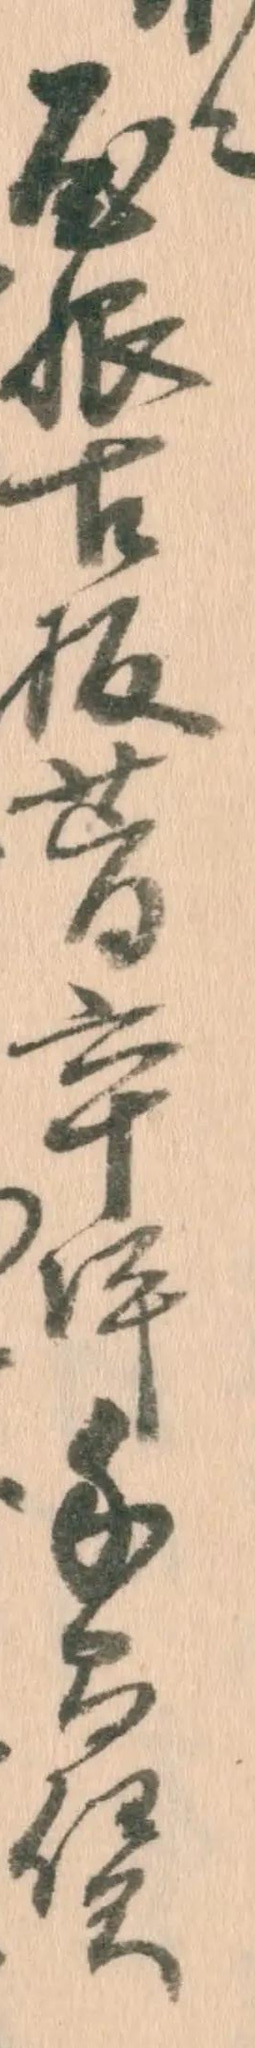屋根古板葺六十坪手間賃
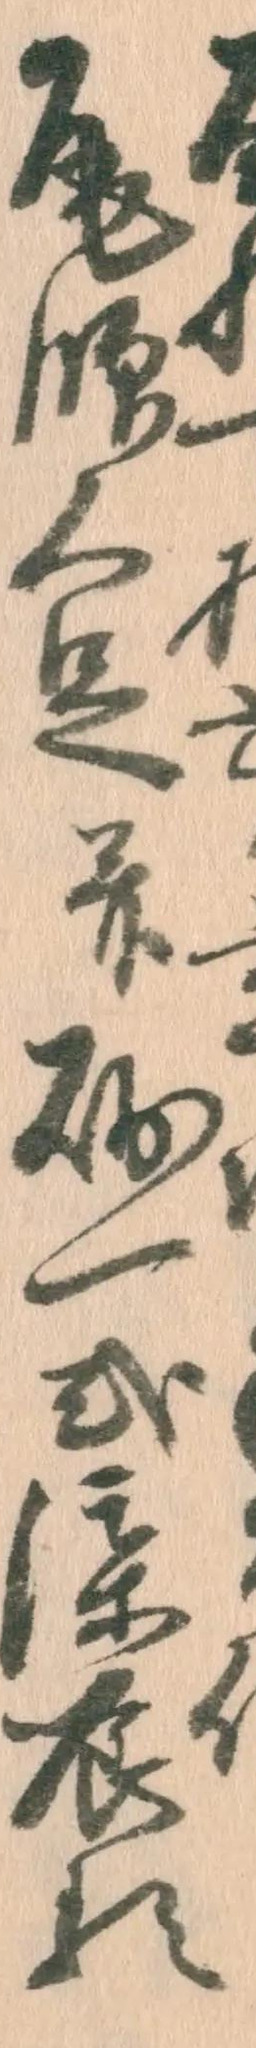瓦師人足幷砂一式漆喰類
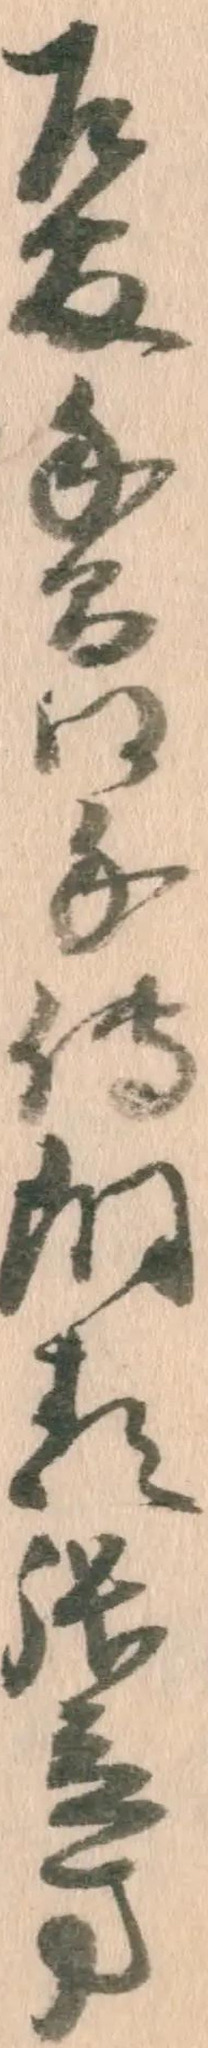左官手間同手伝銅類張立方
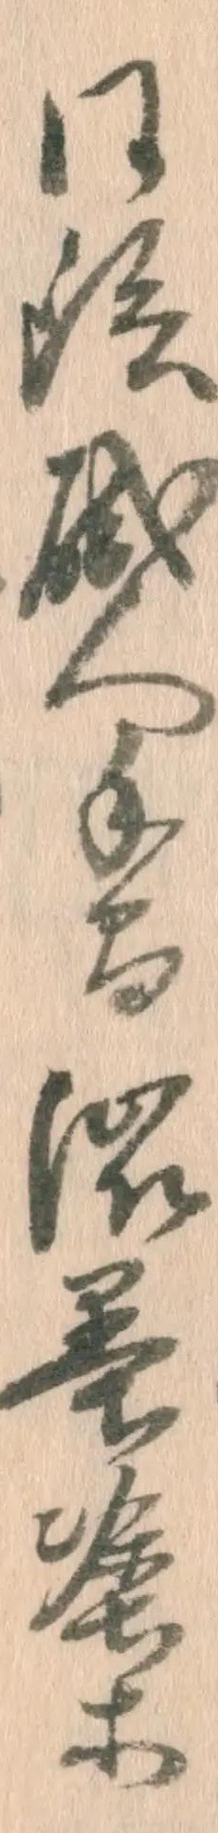同鉄職人手間澁墨塗等
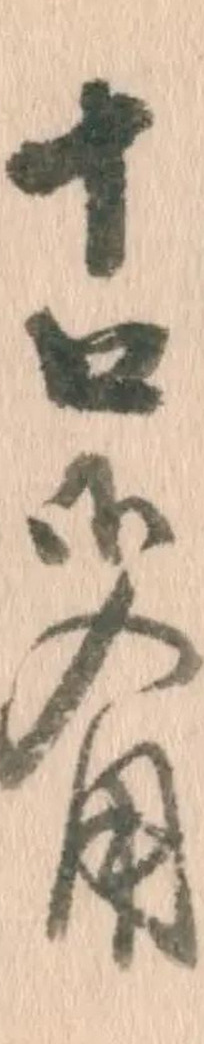十口御入用
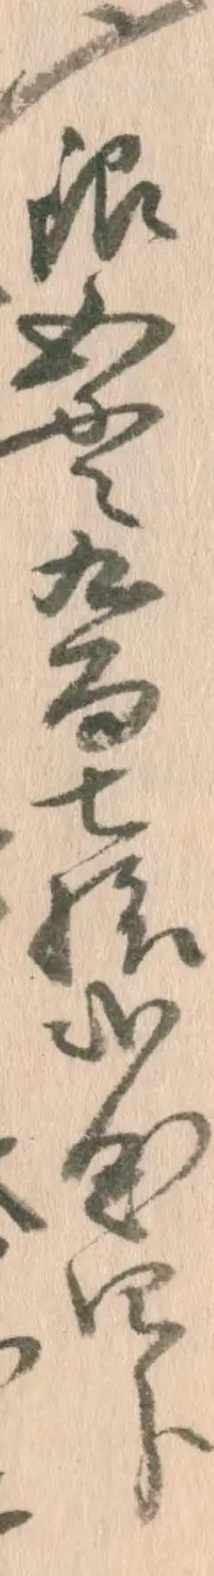〆銀五貫九百七拾弐匁四分
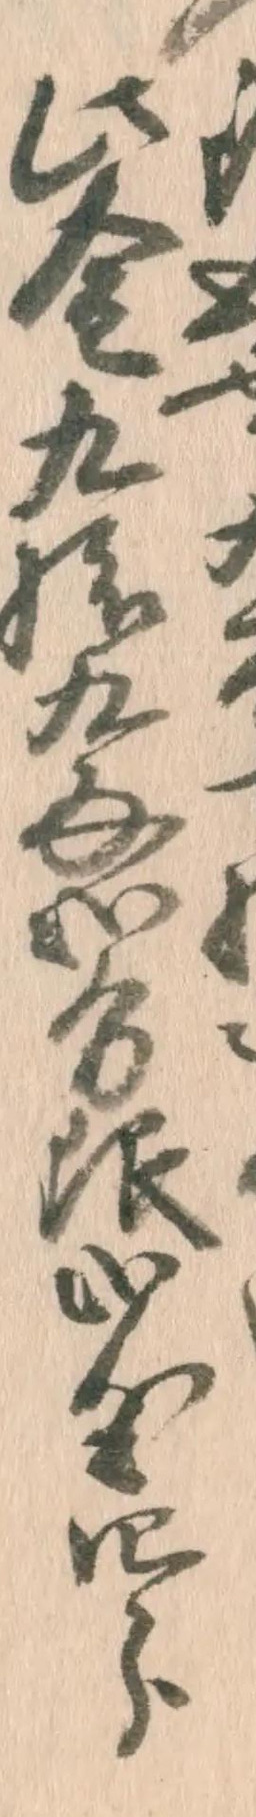此金九拾九両弐分銀弐匁四分
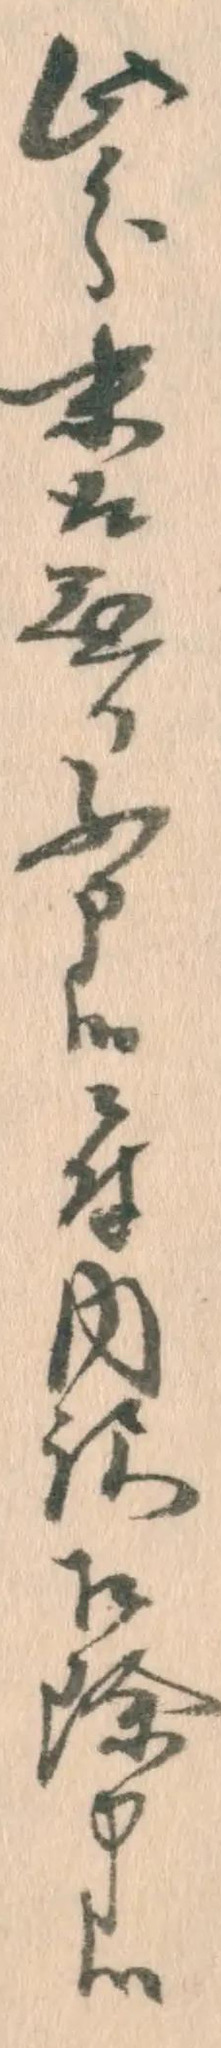此分未取懸り不申候に付内訳相除申候

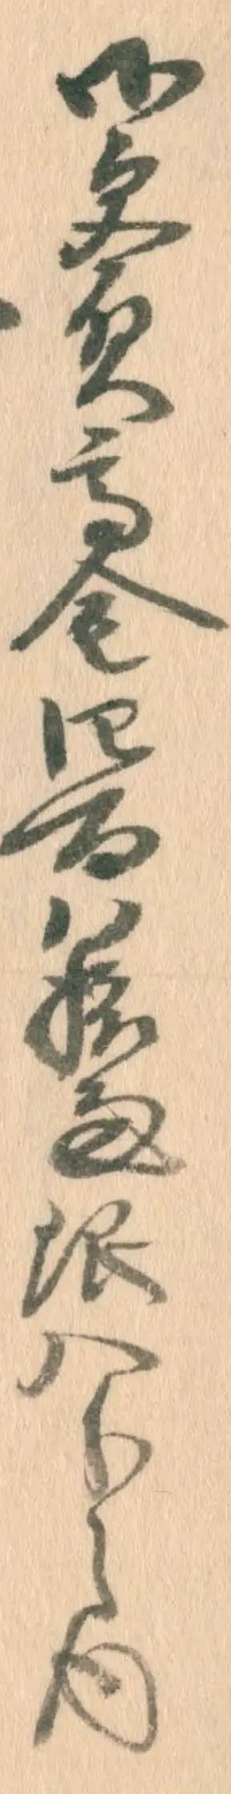御受負高金四百八拾両銀八匁之内
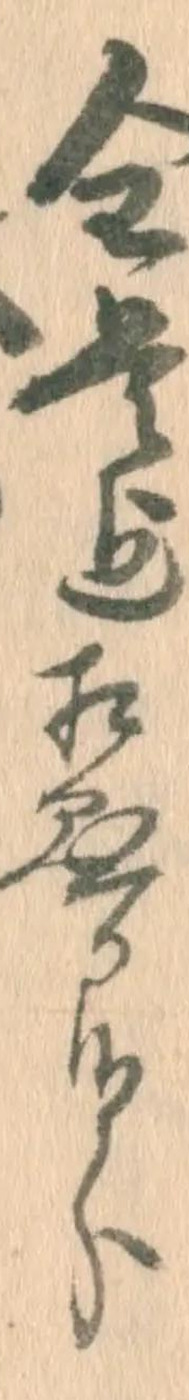金是迄相懸り候分
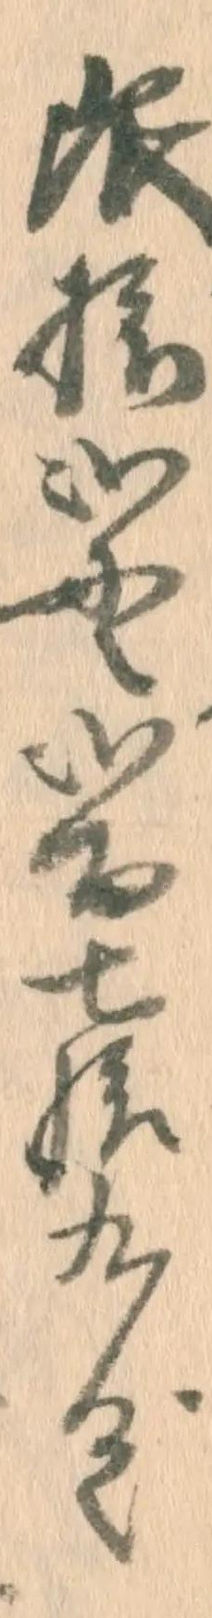銀拾弐貫弐百七拾九匁
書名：三十三間堂. [1]
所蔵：国立国会図書館 National Diet Library, JAPAN
